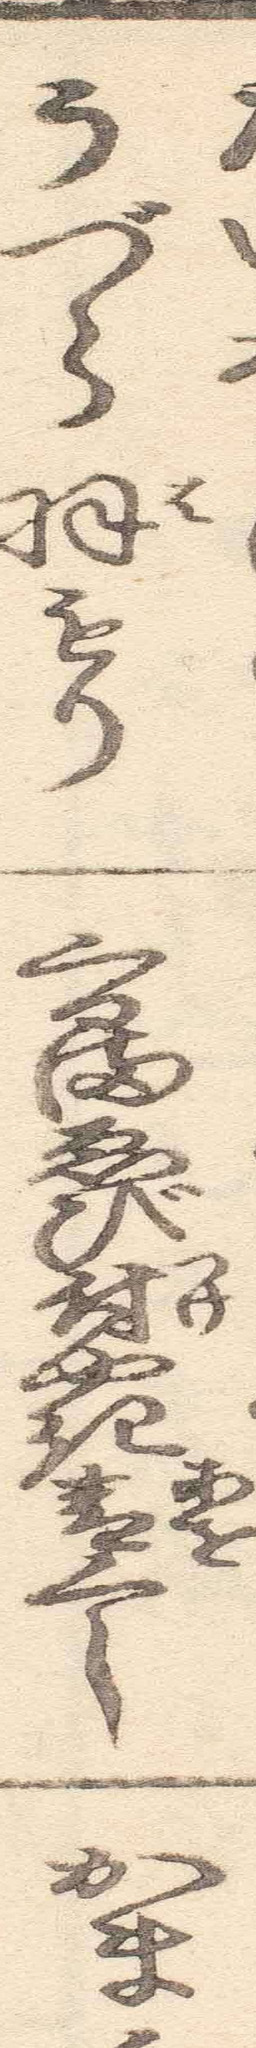うづら羽をりくるまゑび付やき青くし
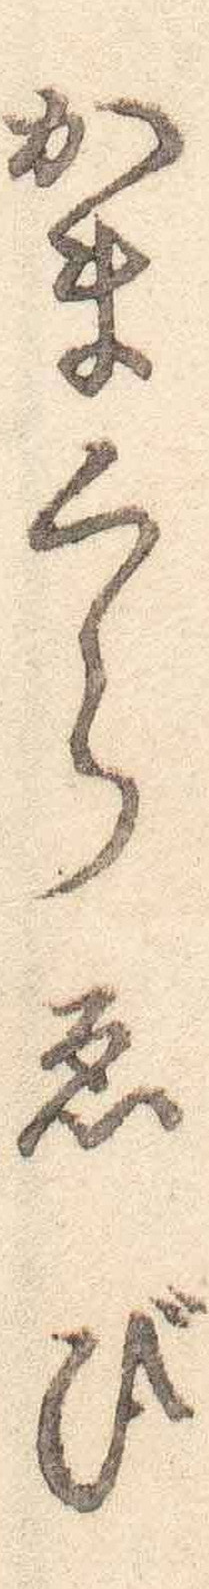かまくらゑび
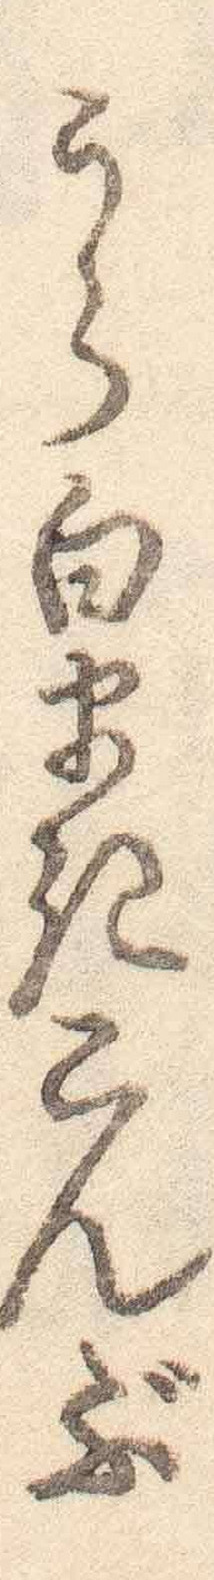うら白まきこんぶ
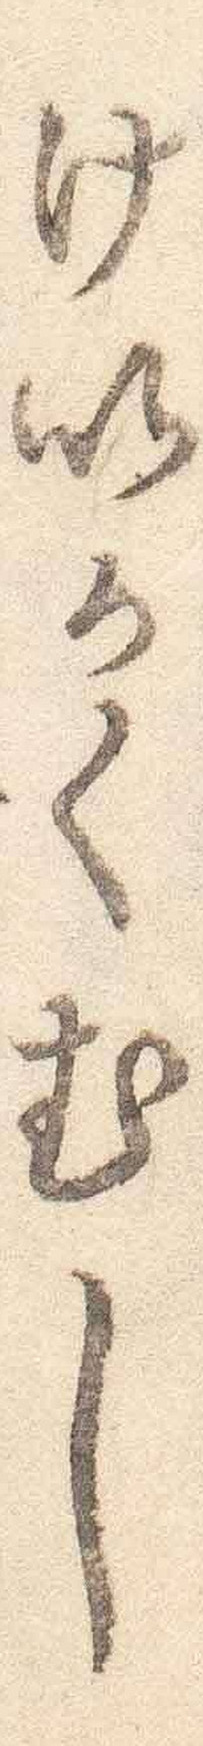けいかくむし
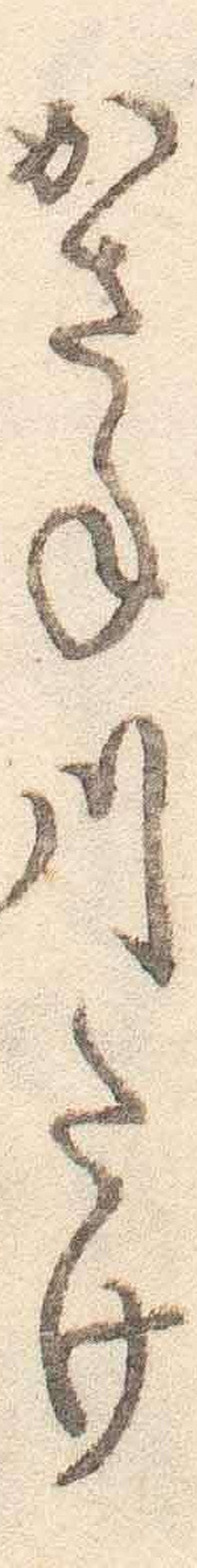かさね川たけ
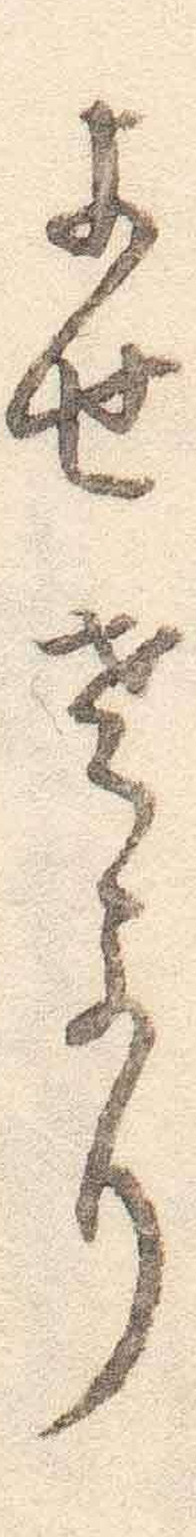よせさより
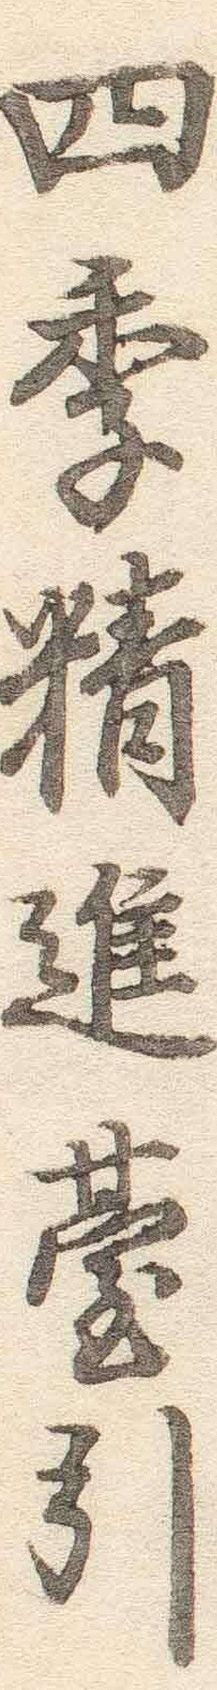四季精進台引
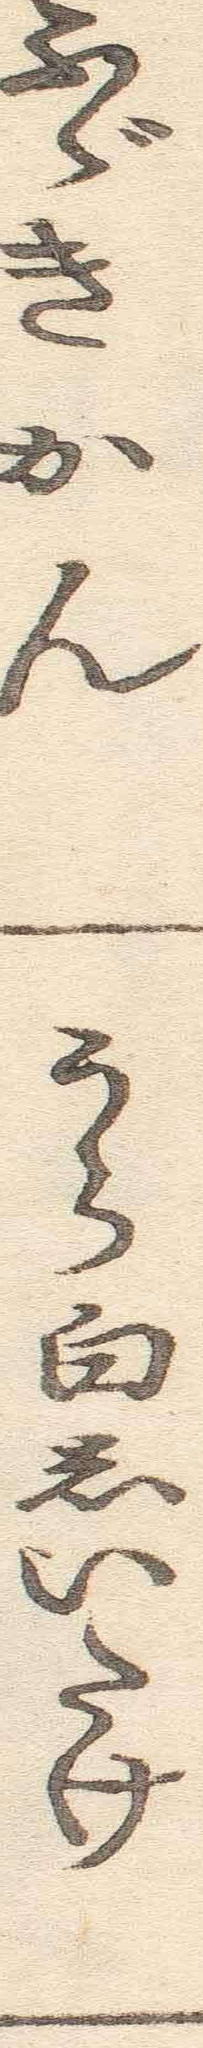ふゞきかんうら白しいたけ
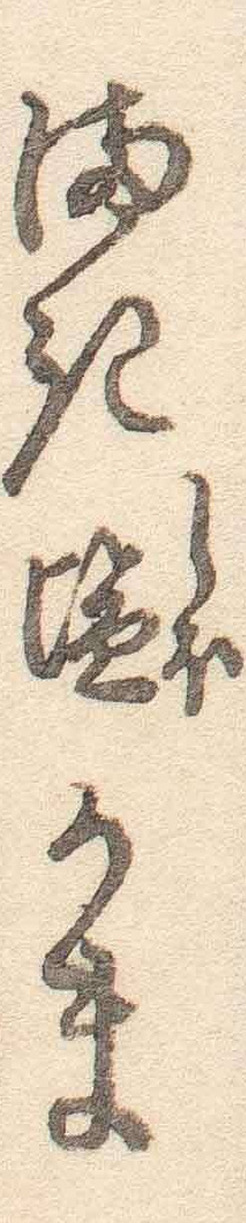まき塩かま
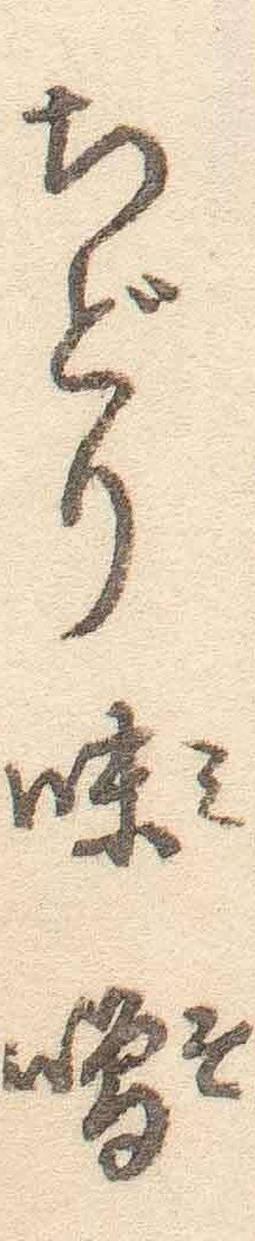ちどり味噌
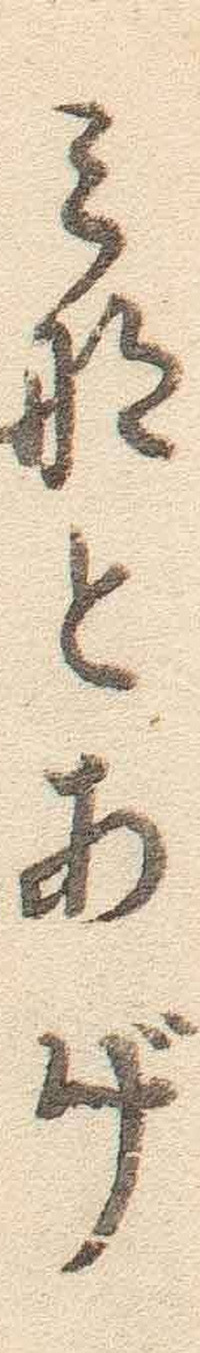みなとあげ
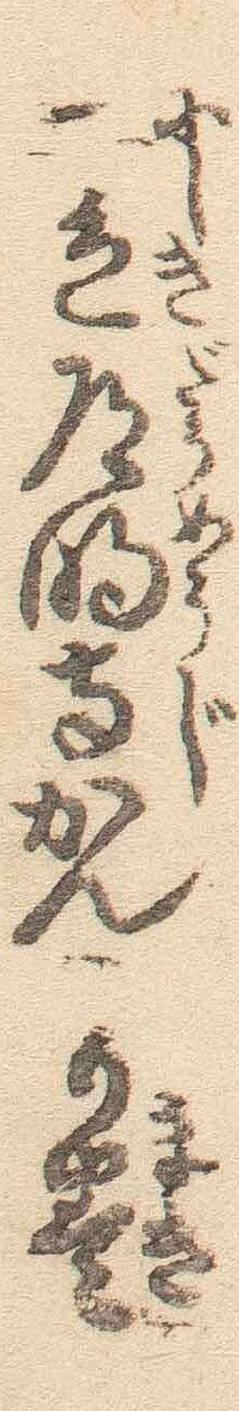二色道明寺かん巻
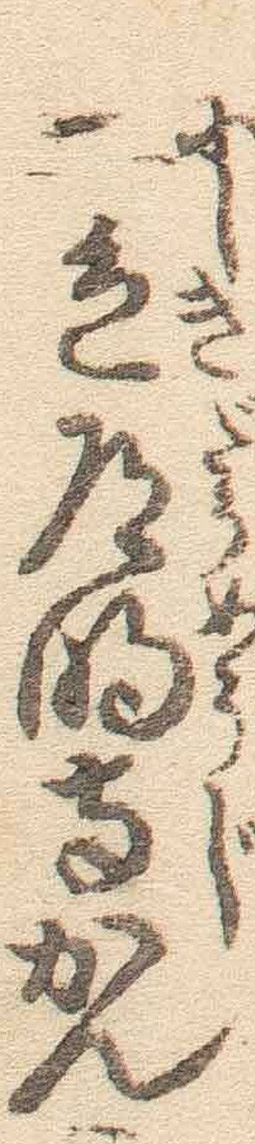二色道明寺かん巻

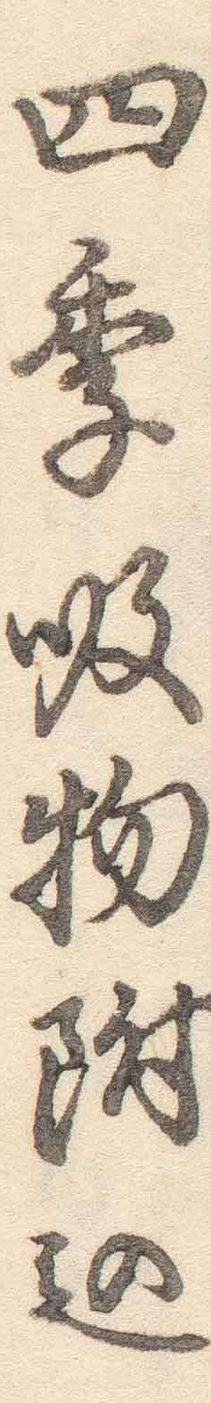四季吸物附込
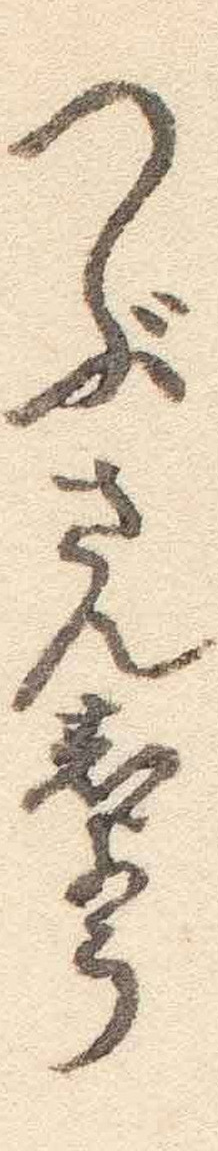こさんしよう
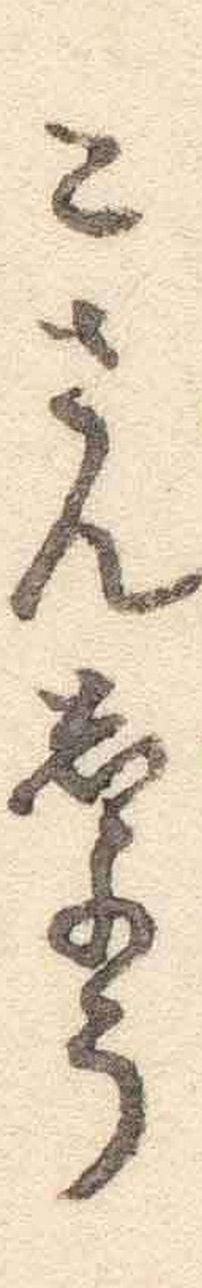こさんしよう
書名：料理通
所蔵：東京学芸大学附属図書館 国文学研究資料館
